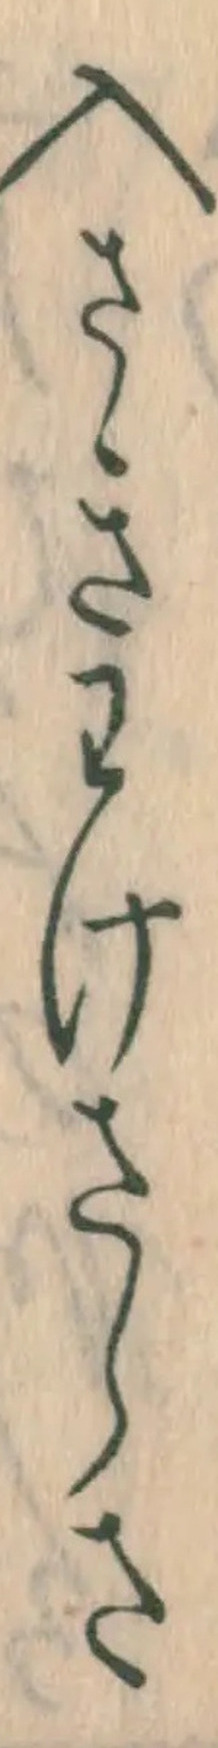入さきわけさらさ
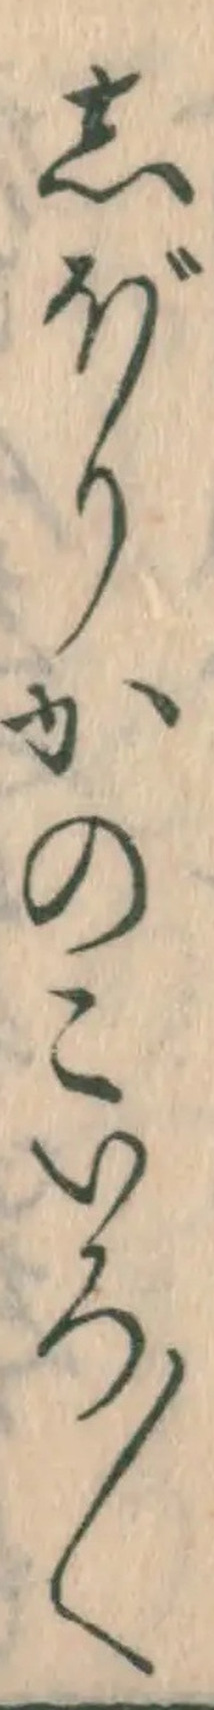しぼりかのこいろ〳〵
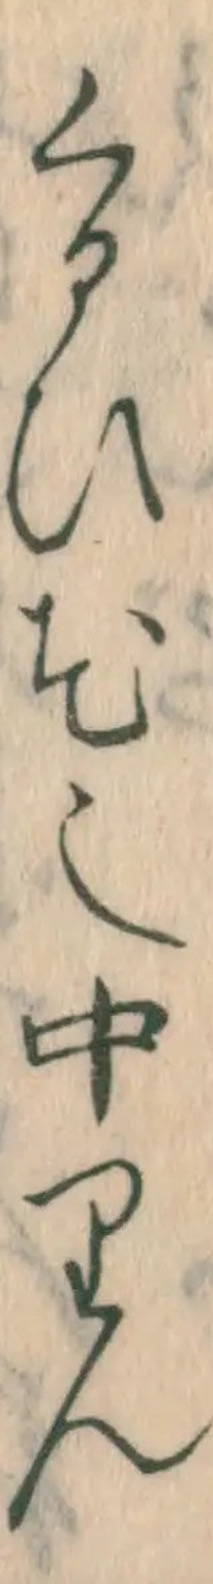くるひ花也中りん
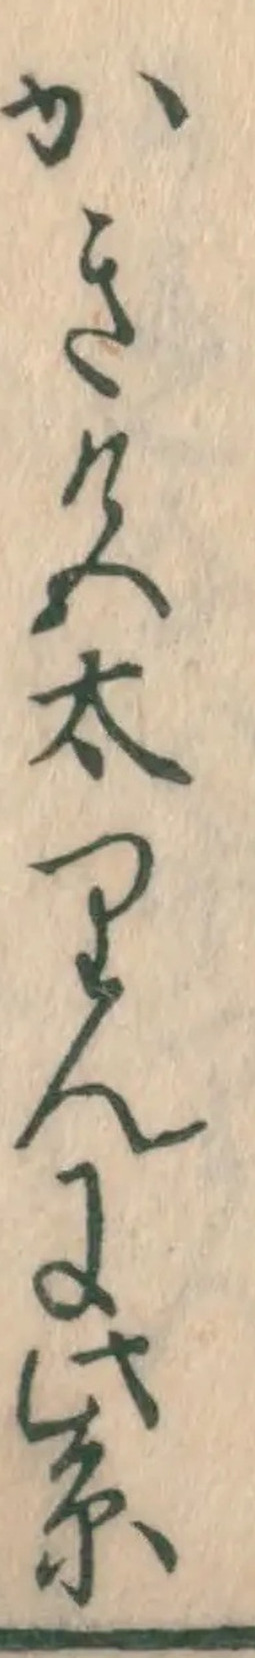かき色太りんに紫
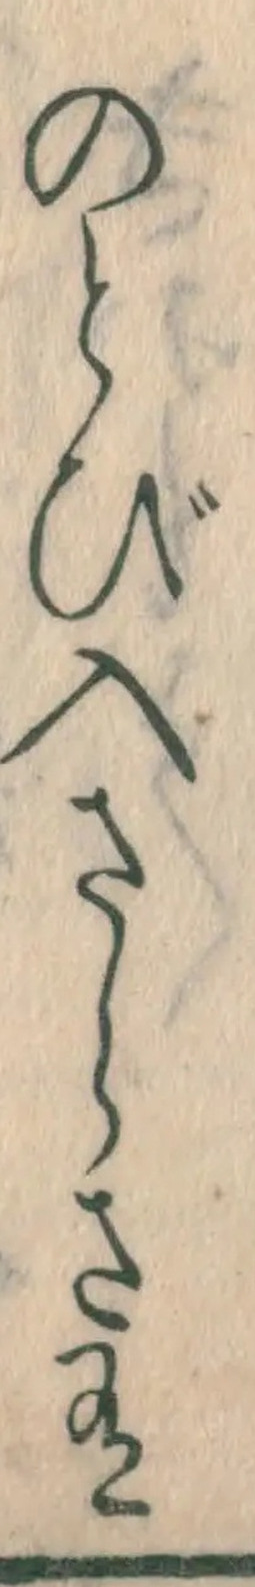のとび入さらさ有

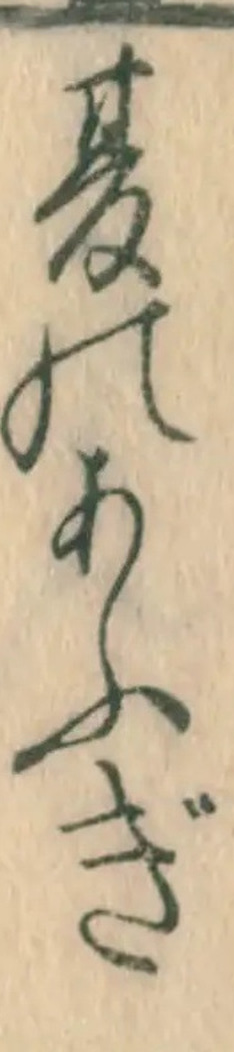夏のあふぎ
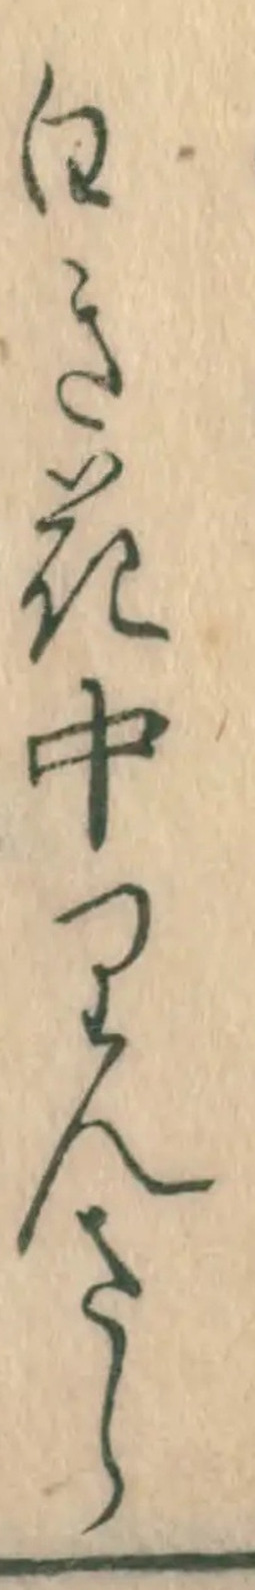白き花中りんさら
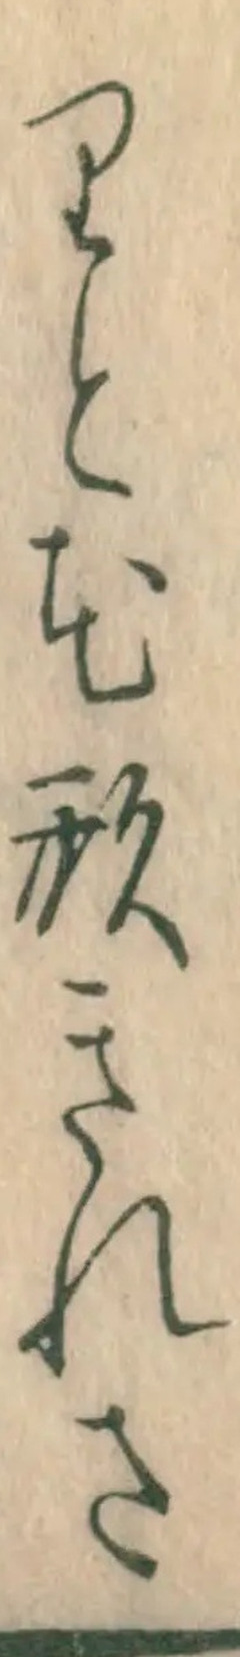りと花形きれさ
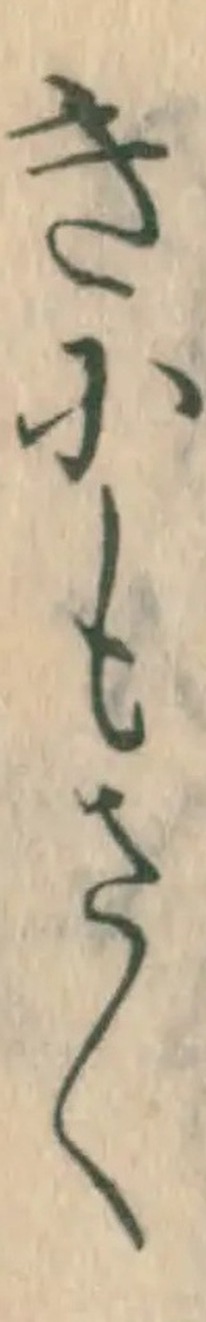きにもさく
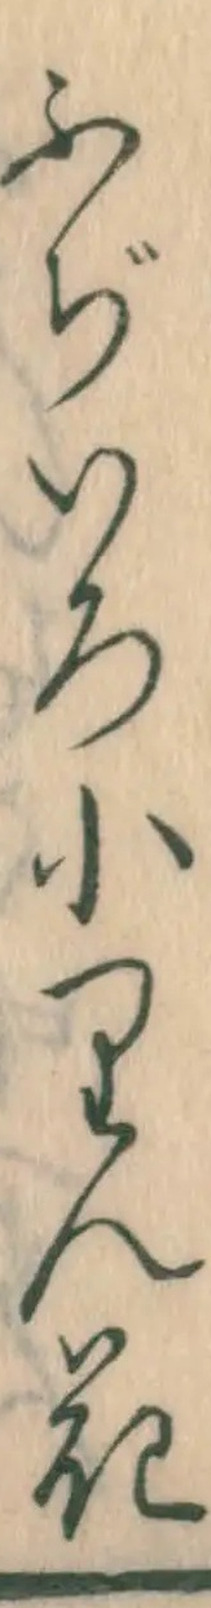ふぢいろ小りん花
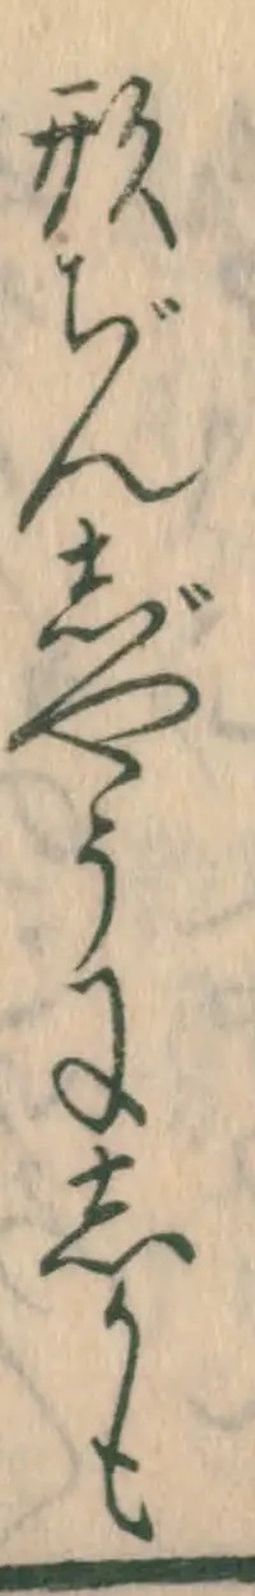形ぢんじやうにしかも
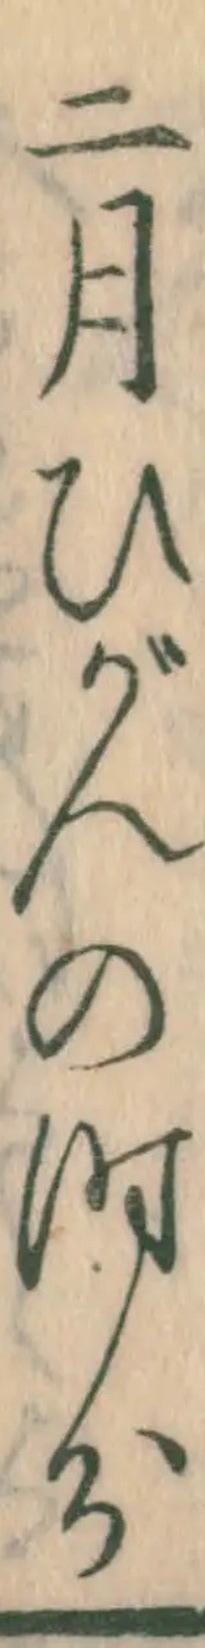二月ひがんの時分
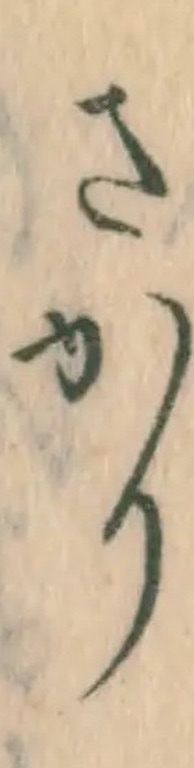さかり
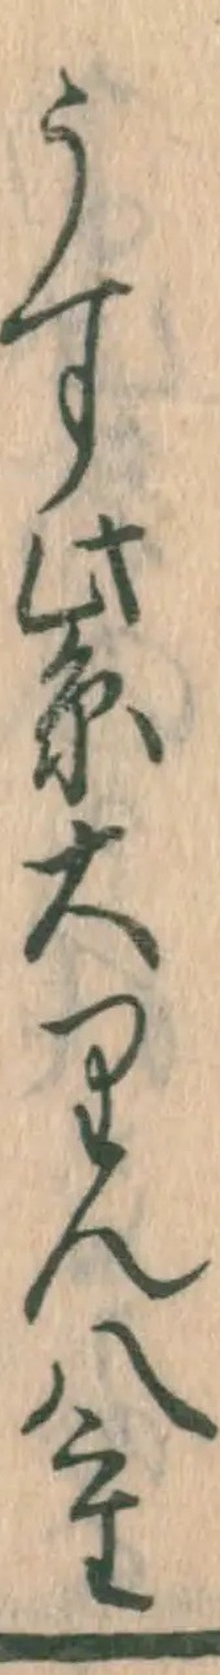うす紫大りん八重
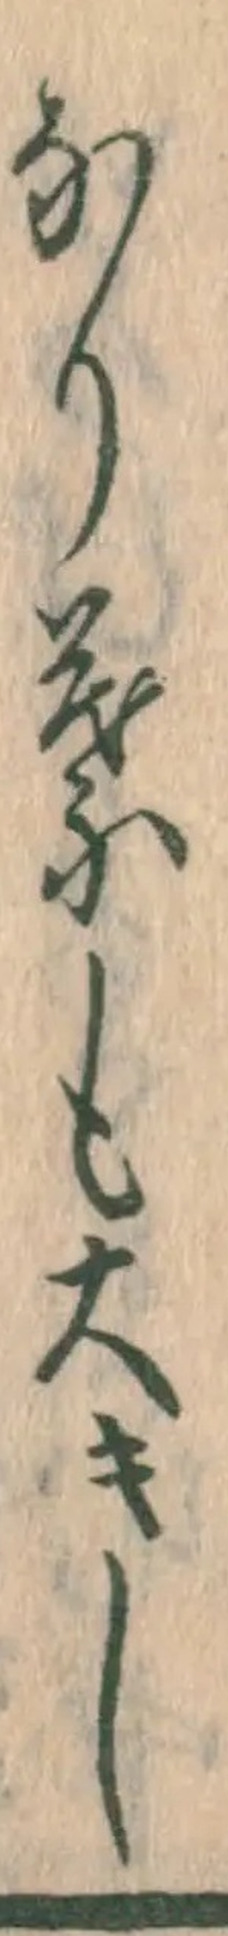なり葉も大きし
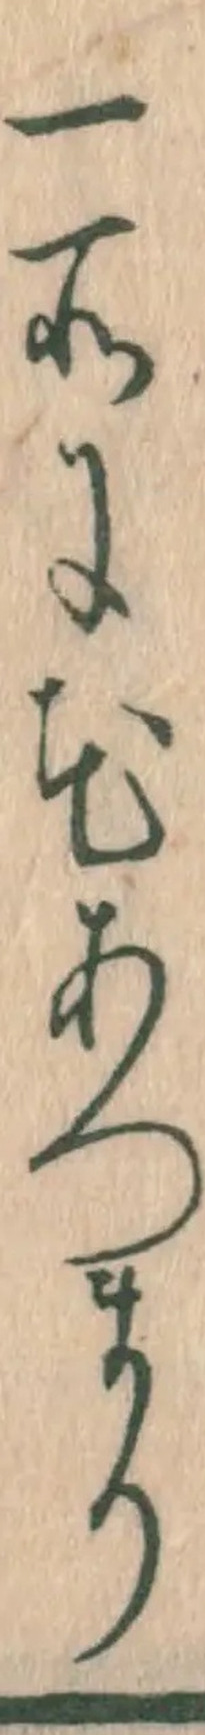一所に花あつまり
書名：錦繍枕 5巻. [3]
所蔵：国立国会図書館 National Diet Library, JAPAN
